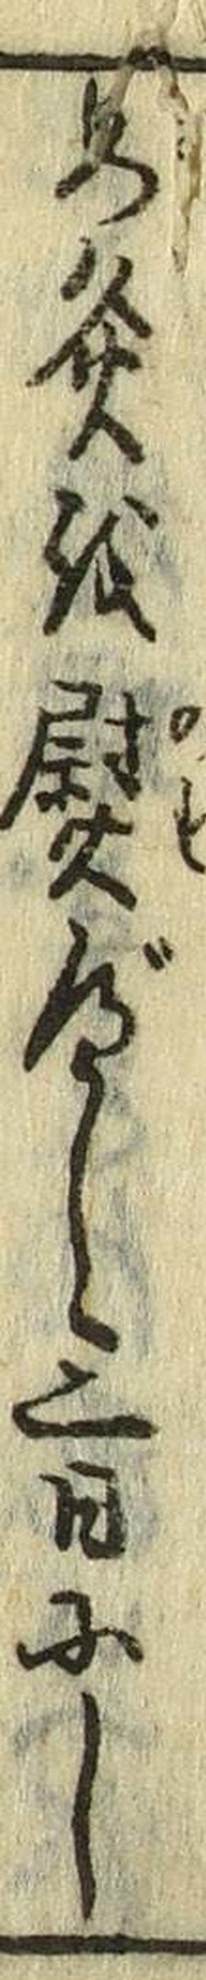め灸を熨べし三日にし
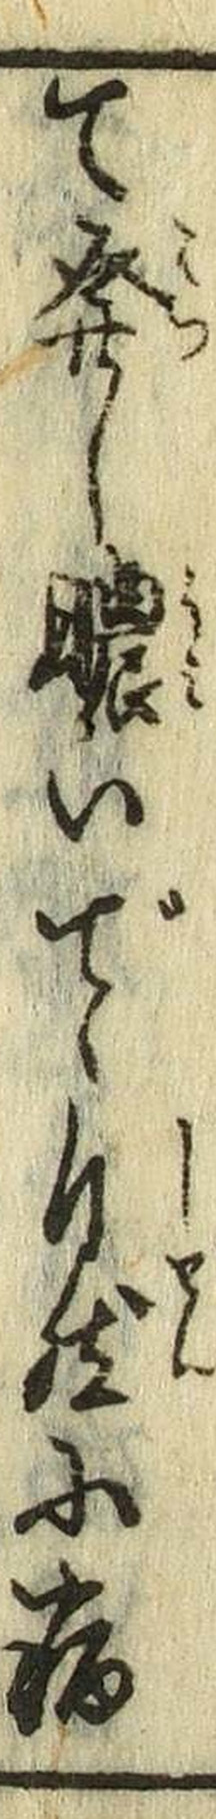て発し膿いでゝ自然に病
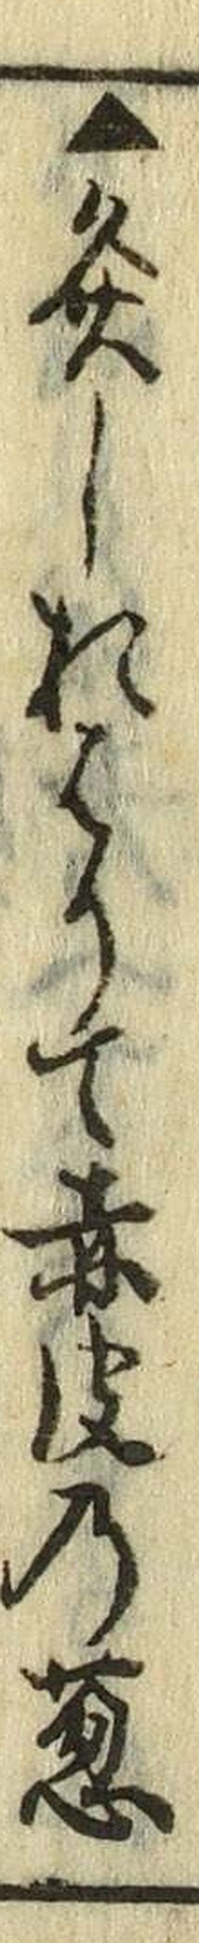▲灸しおはりて赤皮の葱
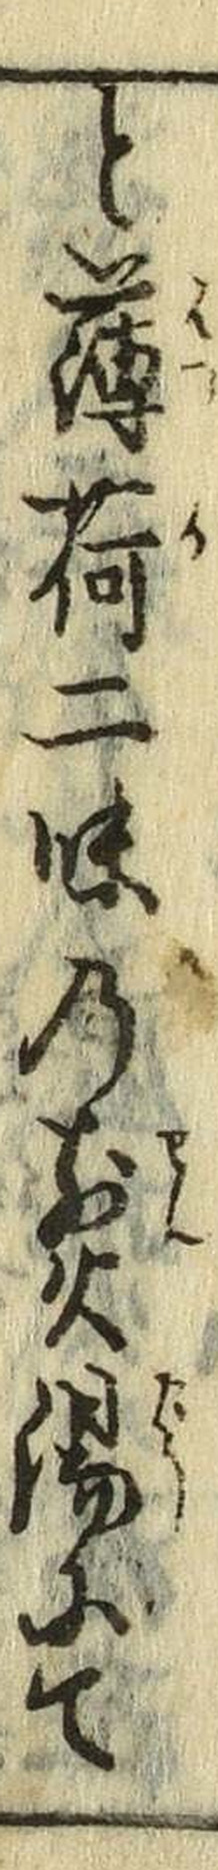と薄荷二味の煎湯にて
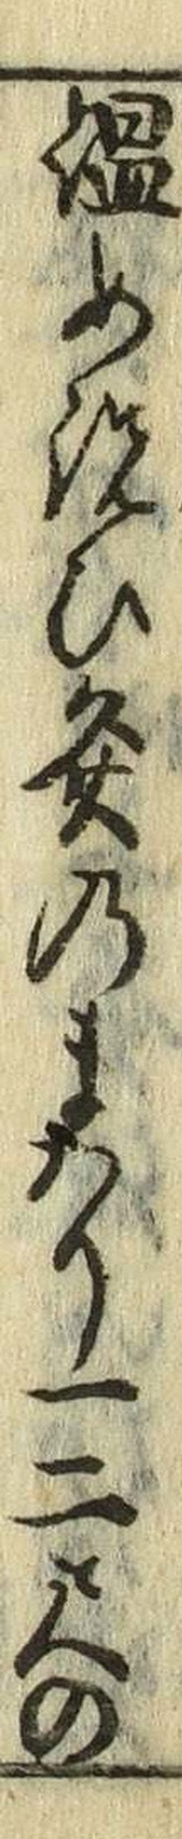温め洗ひ灸のまはり一二尺の
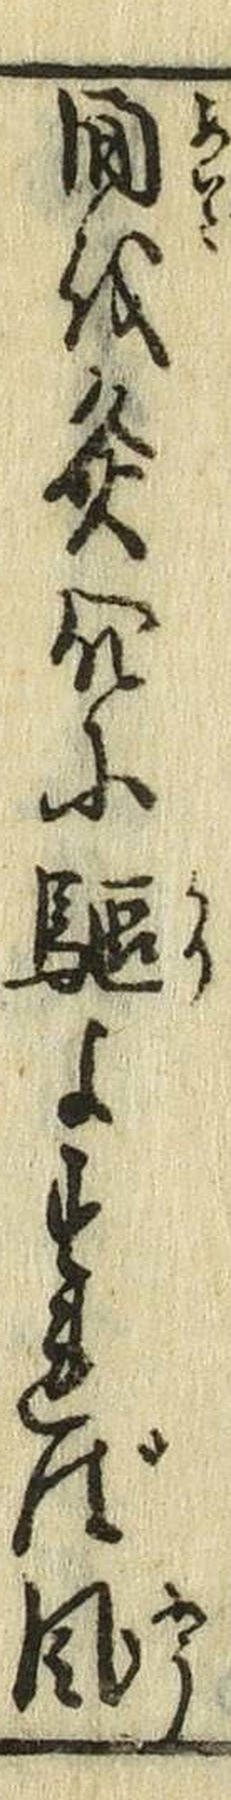間を灸穴に駆よすれば風
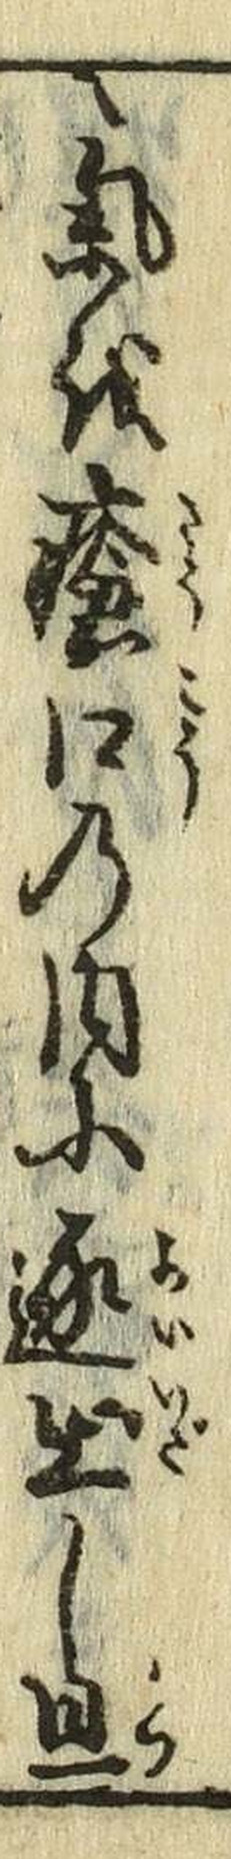気を瘡口の内に逐出し且
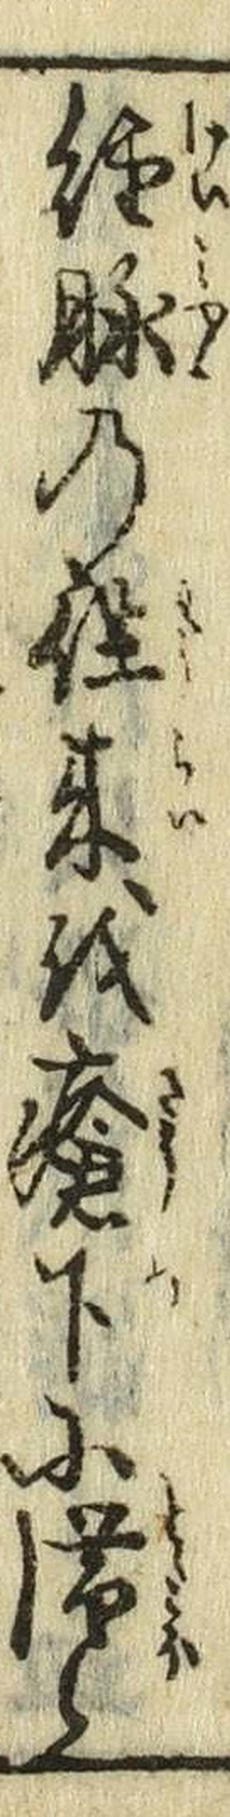経脈の往来を瘡下に滞ら
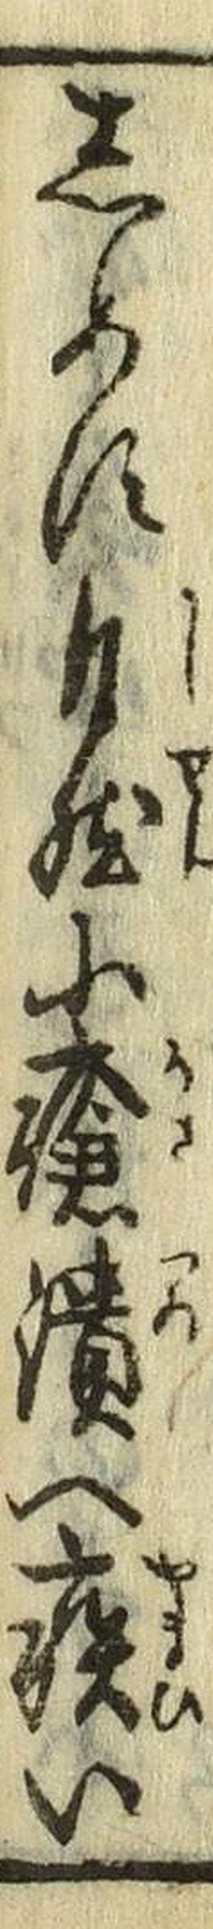しめす自然に瘡潰へ疾い
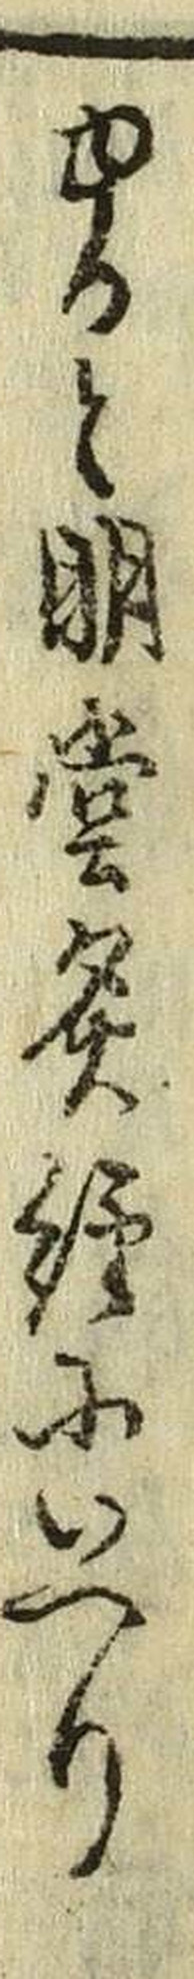ゆると明堂灸経にいへり
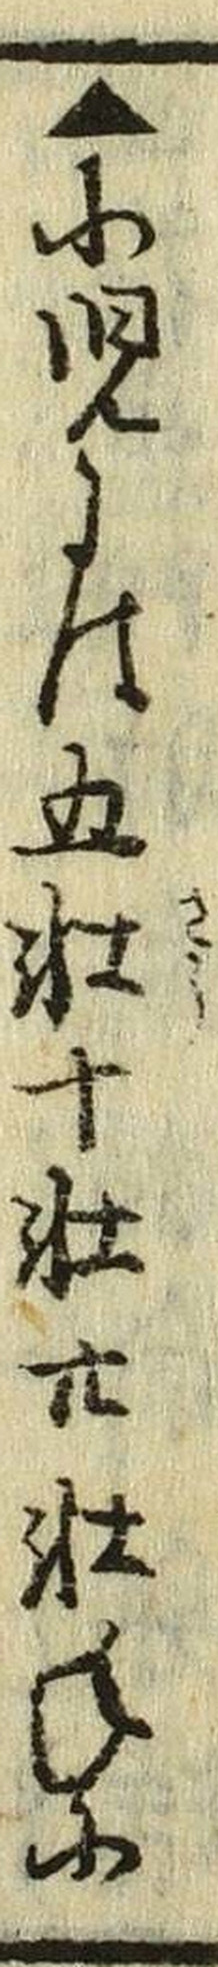▲小児には五壮十壮廿壮年に
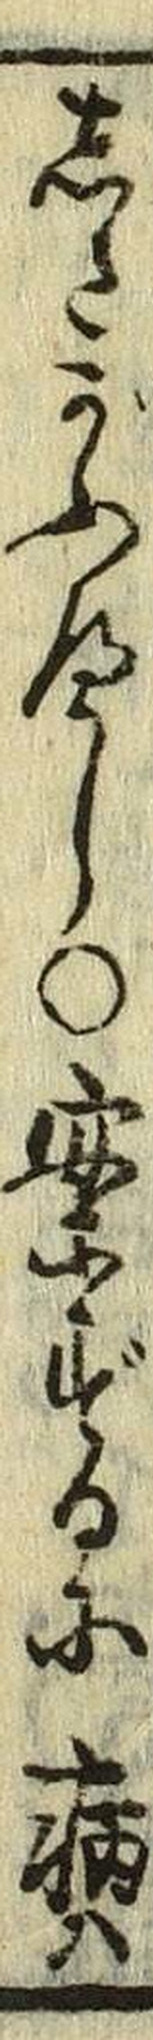したがふへし○案ずるに病は
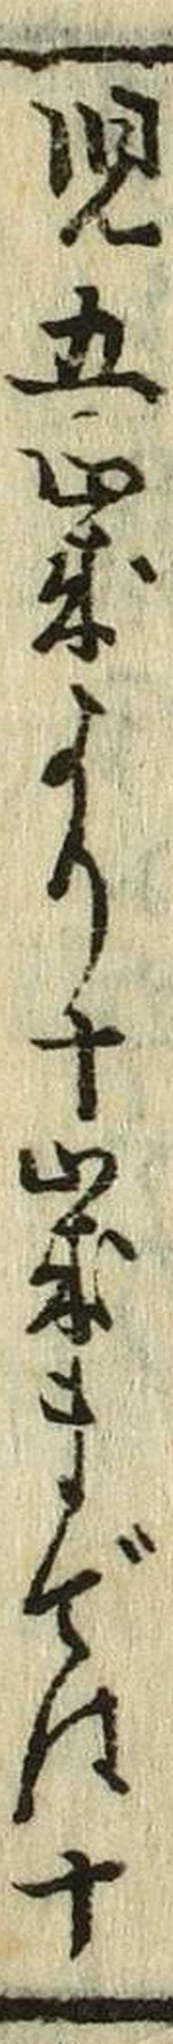児五歳より十歳までは十
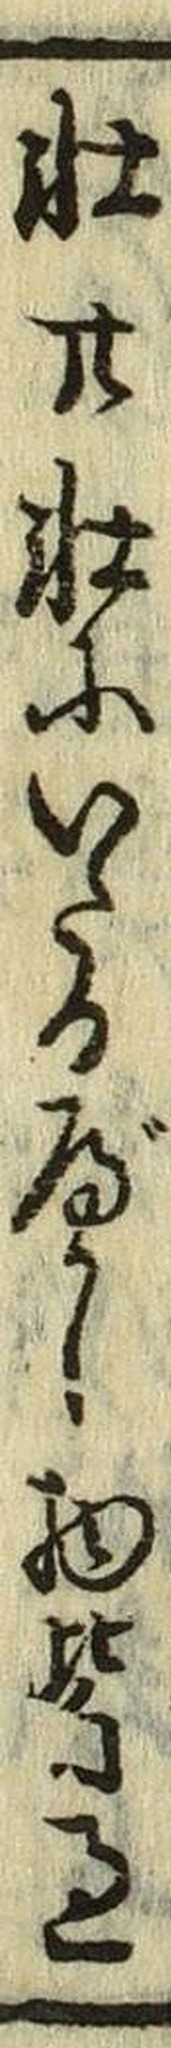壮廿壮にいたるべし物皆過
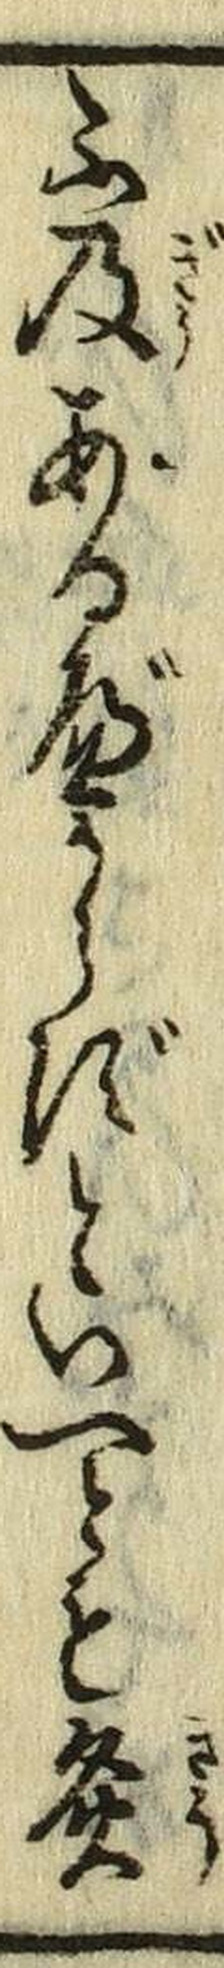不及あるべからずといへとも灸
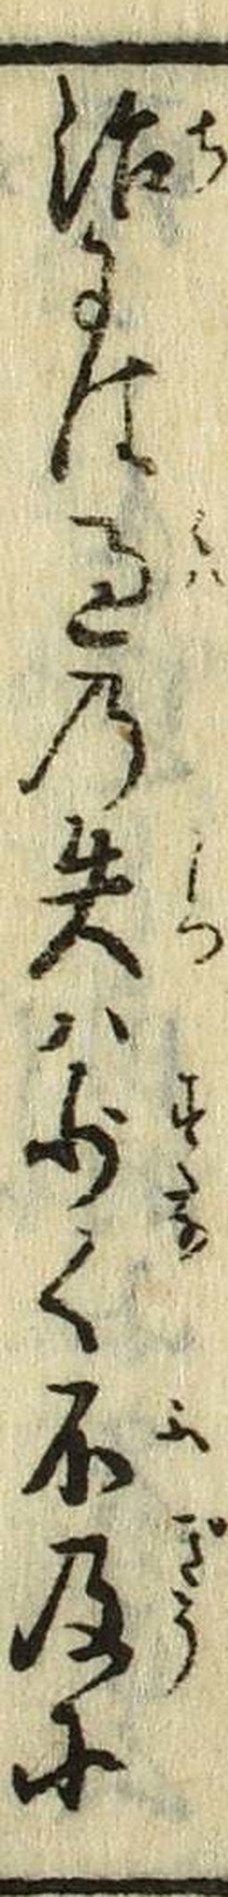治には過の失は少く不及に
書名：居家養生記
